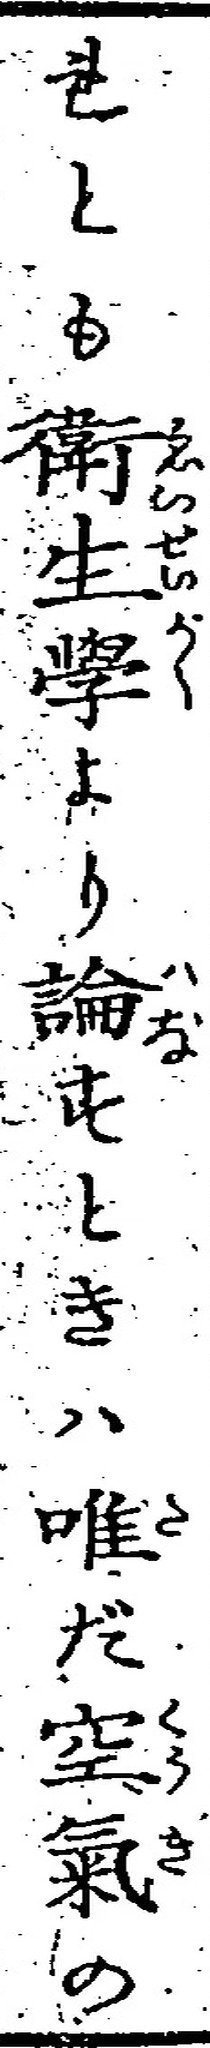れとも衛生学より論すときは唯だ空気の
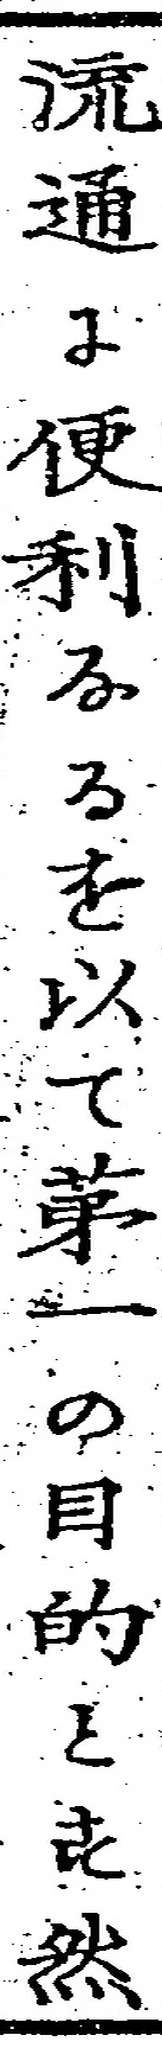流通に便利なるを以て第一の目的とす然
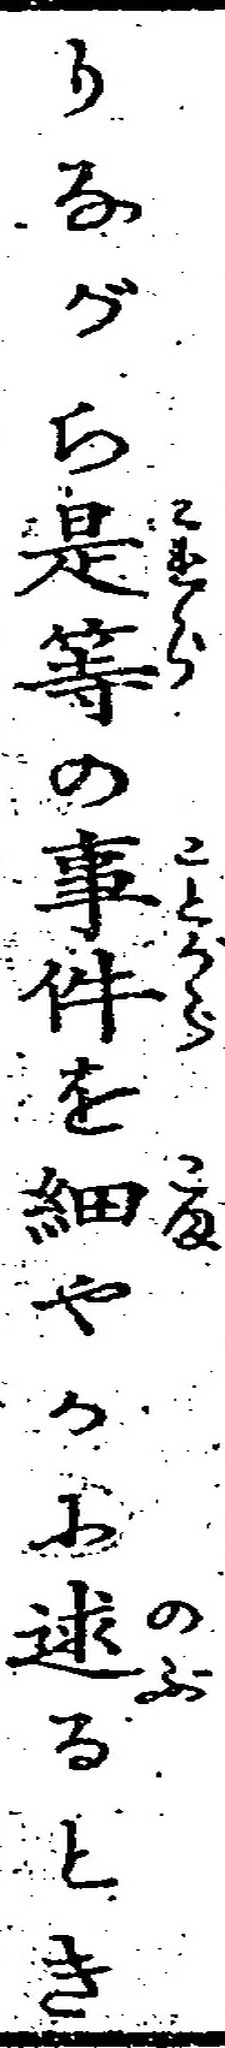りながら是等の事件を細やかに述るとき
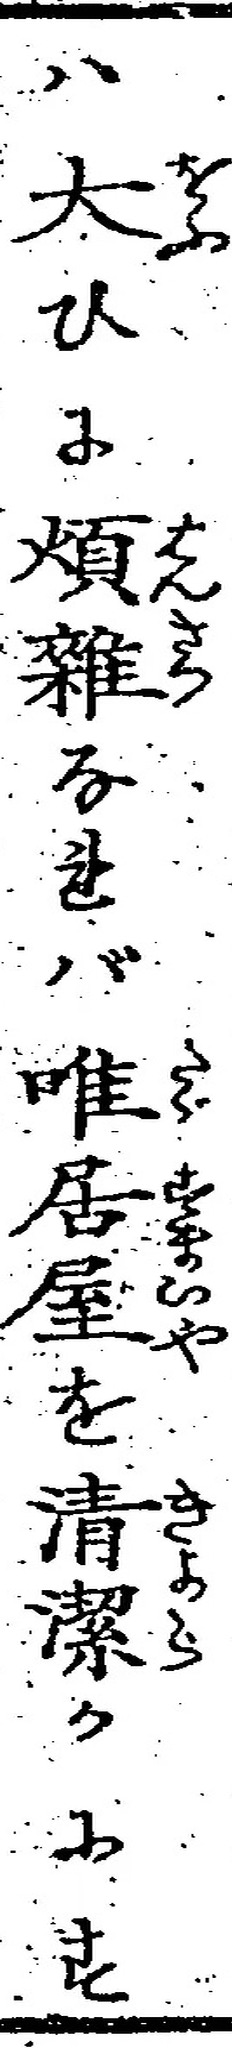は大ひに煩雑なれば唯居屋を清潔かにす
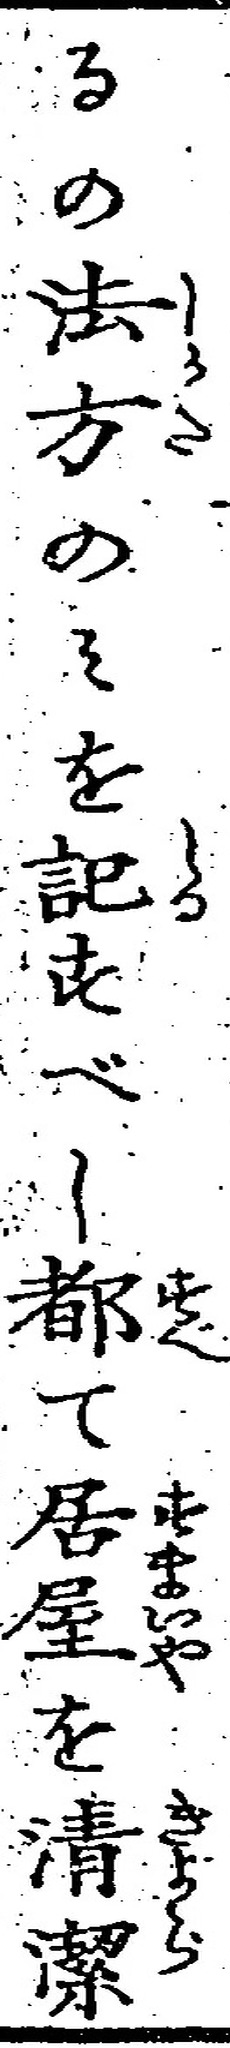るの法方のみを記すべし都て居屋を清潔
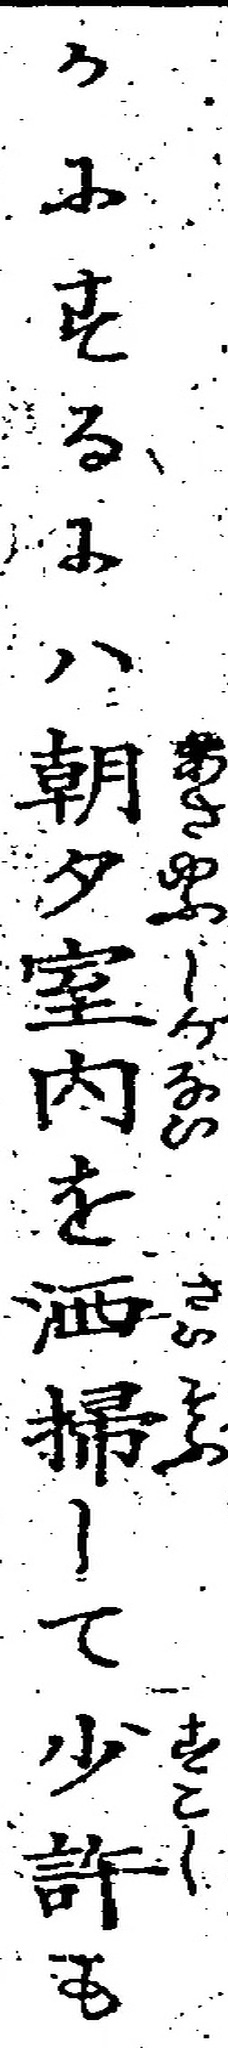かにするには朝夕室内を洒掃して少許も
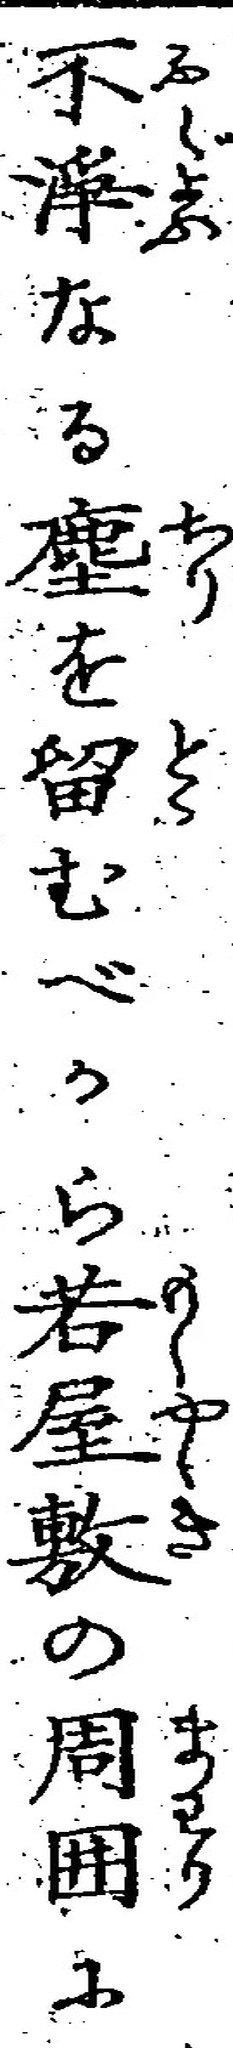不浄なる塵を留むべから若屋敷の周囲に
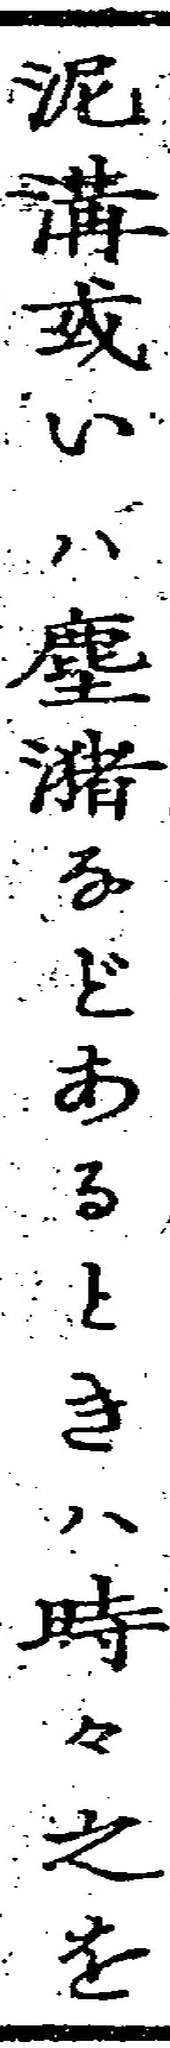泥溝或いは塵潴などあるときは時々之を

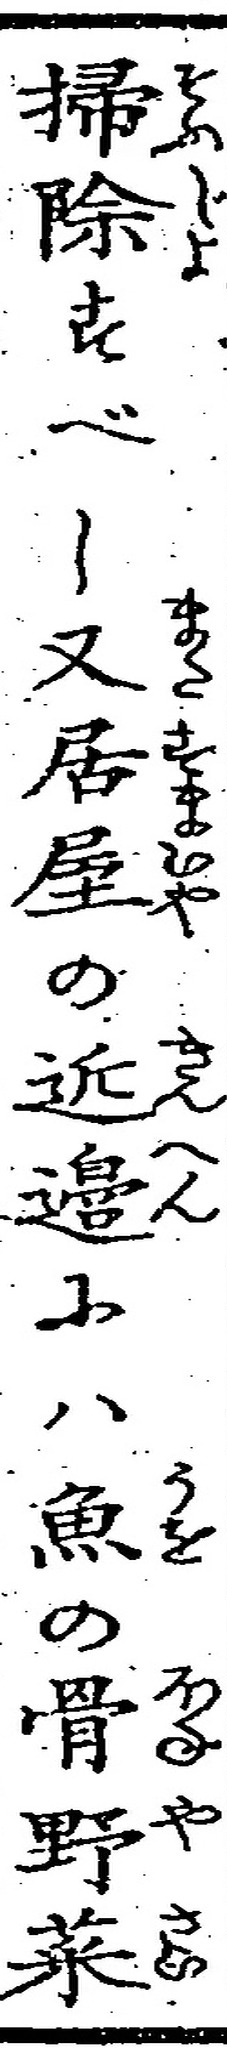掃除すべし又居屋の近辺には魚の骨野菜
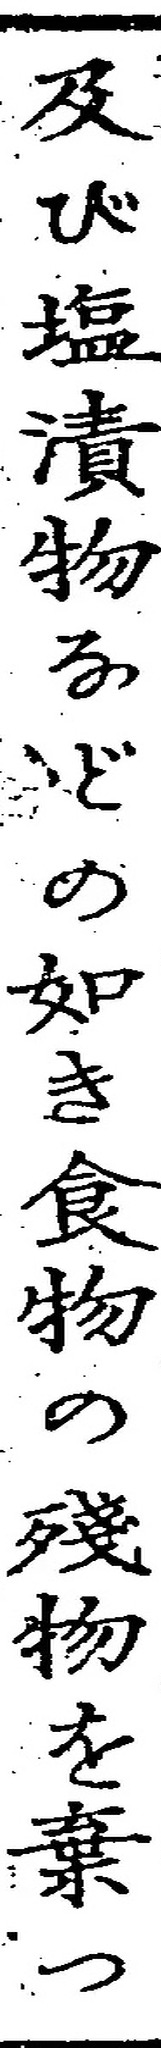及び塩漬物などの如き食物の残物を棄つ
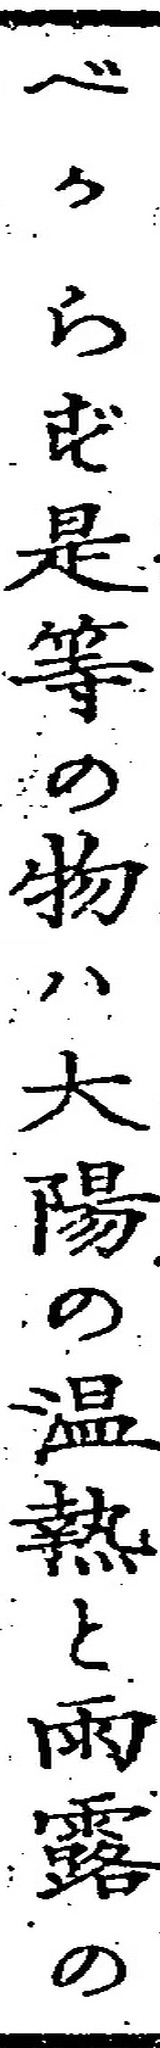べからず是等の物は大陽の温熱と雨露の
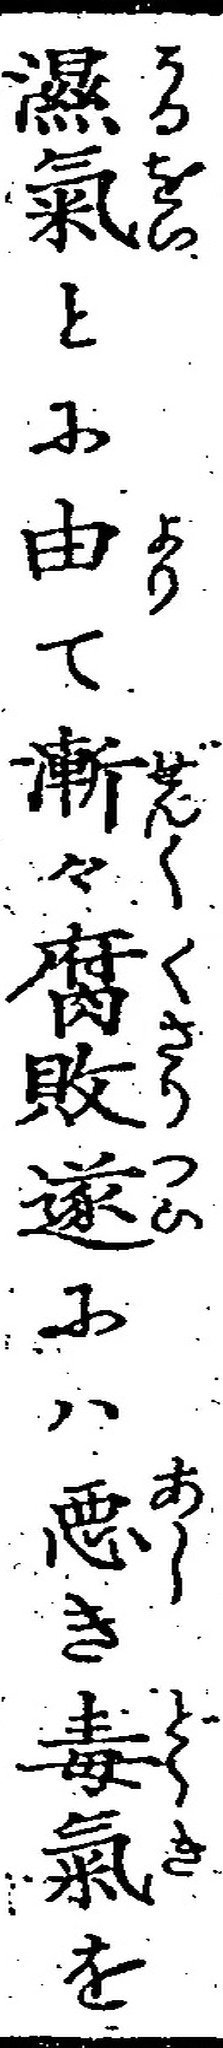湿気とに由て漸々腐敗遂には悪き毒気を
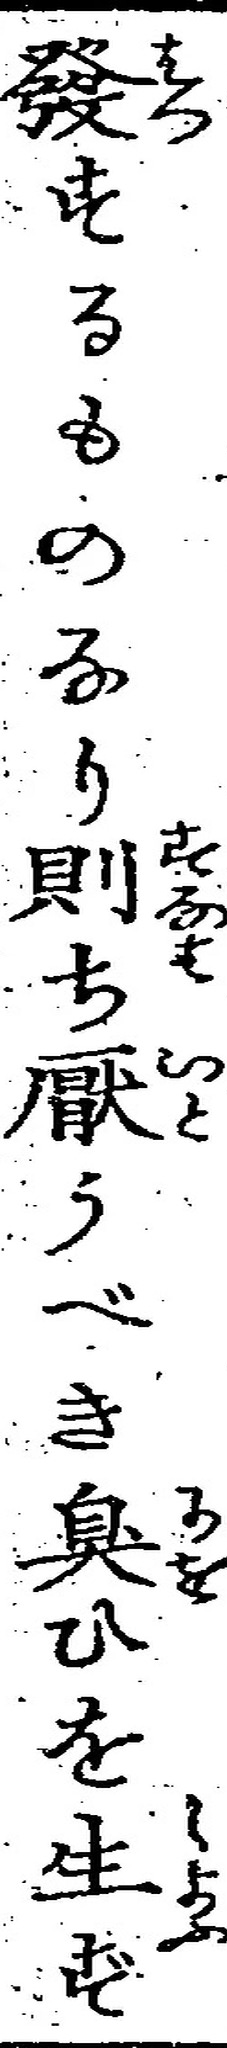発するものなり則ち厭うべき臭ひを生ず
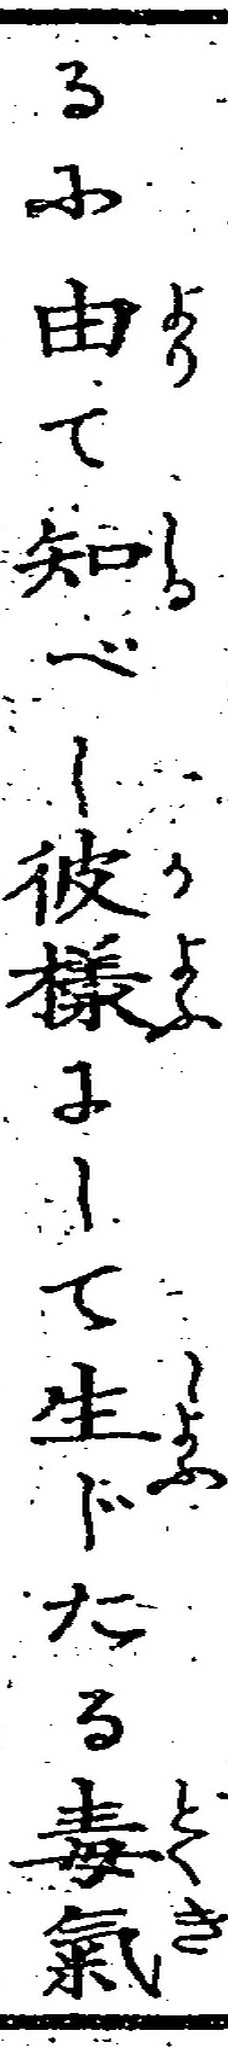るに由て知べし彼様にして生じたる毒気
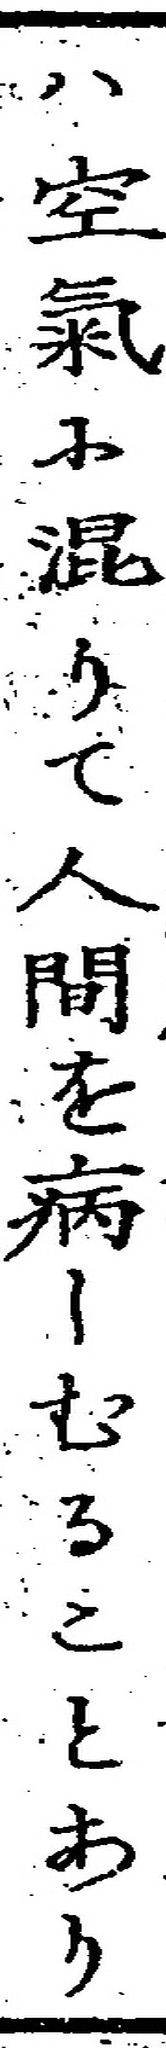は空気に混りて人間を病しむることあり
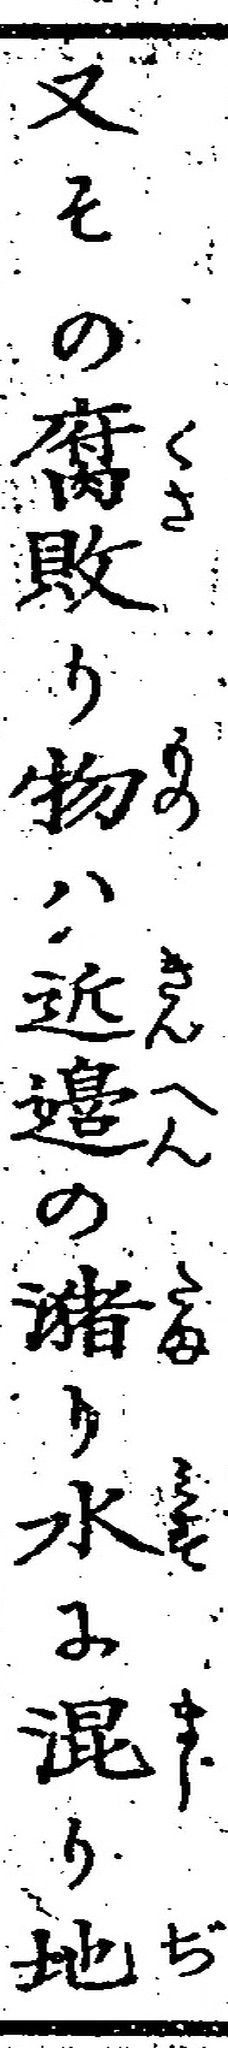又その腐敗り物は近辺の潴り水に混り地
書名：コレラ予防命乃後見
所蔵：国立国会図書館 National Diet Library, JAPAN
